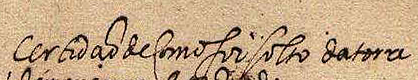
certidaõ de Como foi solto da torre
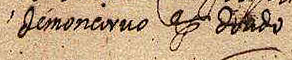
de moncoruo p̄ doudo
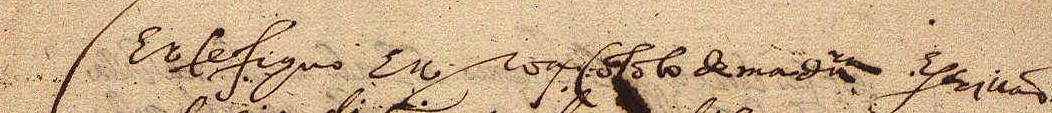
Certefiquo Eu Ioaõ Cozolo de madura Escriuaõ
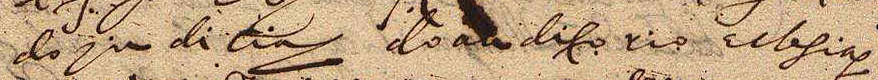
do judicial do auditorio Eclesias
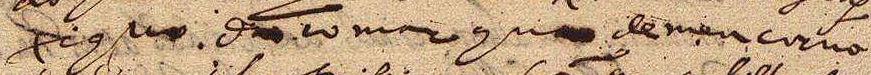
tiquo da comarqua de mencoruo
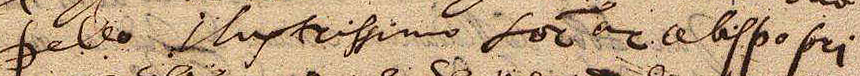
pello Ilustrissimo sor̄ arcebispo pri
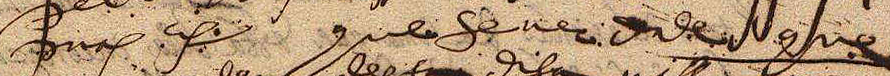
mas cꝭ que he uerdade que
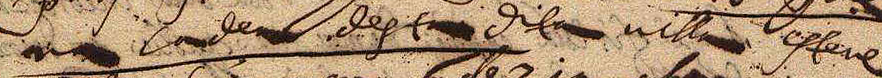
na cadea desta dita uilla esteue
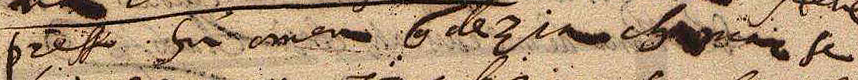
presso hū omem q̄ dezia chamar se
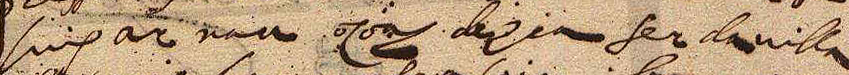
luis arnau o Coal dezia ser da uilla
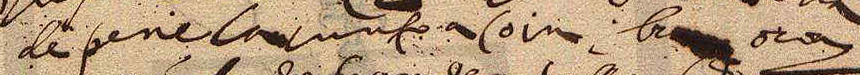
de penela iunto a Coimbra o coal
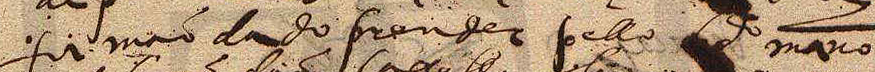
foi maõdado prender pello ldo mano
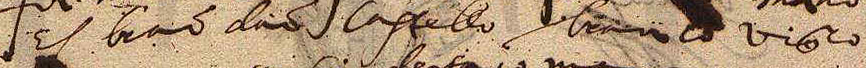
El braõdaõ castello branco vigro
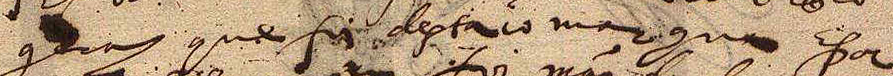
geral que foi desta comarqua E por
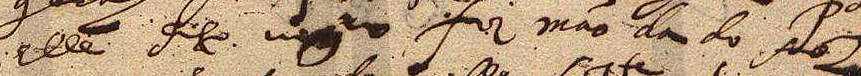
Elle dito uigro foj mãodado soL
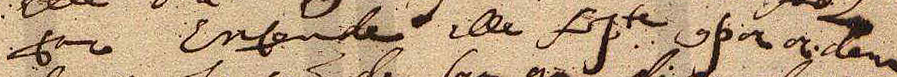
tar Entende elle sop.te q̄ por ordem
